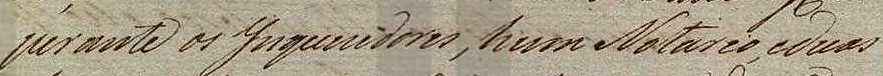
perante os Jnquisidores, hum Notario, e duas
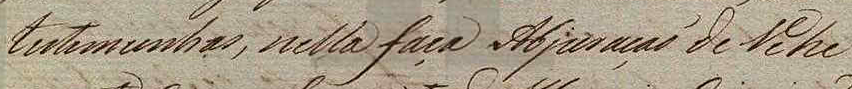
testemunhas, nella faça Abjuraçaõ de Vehe
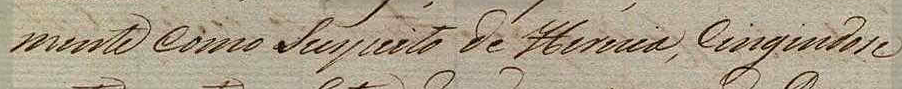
mente como suspeito de Herezia, Cingindose
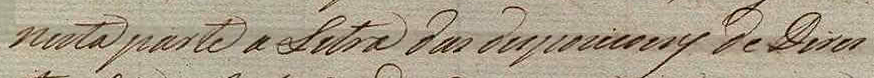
nesta parte a Letra das dispozicoens de Direi
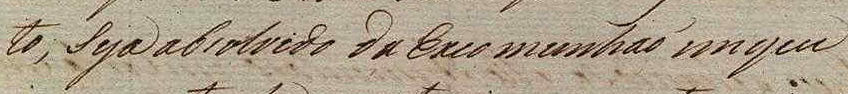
to, seja absolvido da Excomunhaõ em que
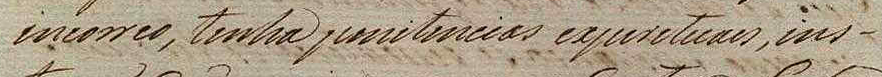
incorreo, tenha penitencias experituais, ins
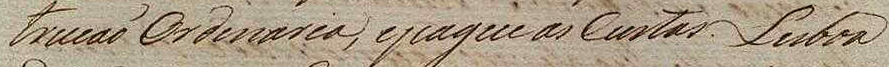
trucaõ Ordinaria, e pague as Custas. Lisboa
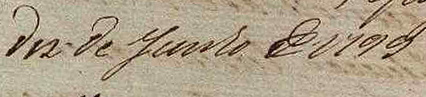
dez de Junho d̄ 1799
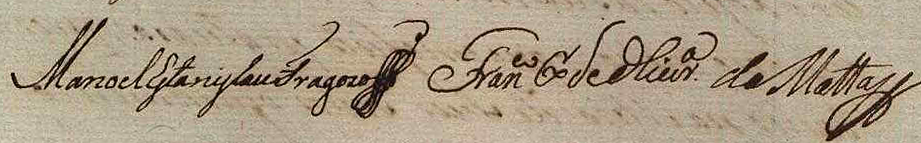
Manoel Estanislau Fragozo Fran.co X.r de Olivr.a da Matta
